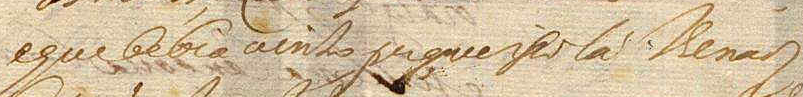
e que bebia uinho porque isso lá lhe naõ
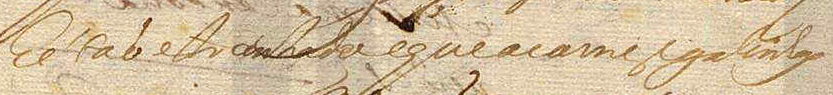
hé taõ estranhado e que a carne e galinhas
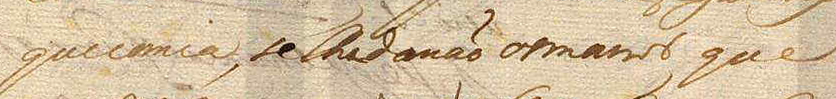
que comia, se lhe dauaõ os mouros que
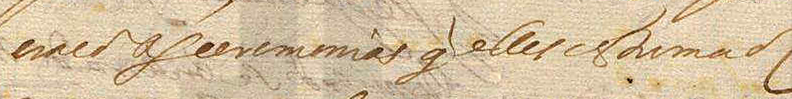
era cō as ceremonias q̄ elles costumaõ
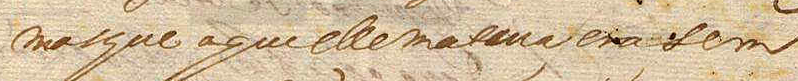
mas que a que elle mataua era sem
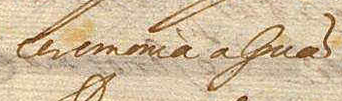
ceremonia alguā.
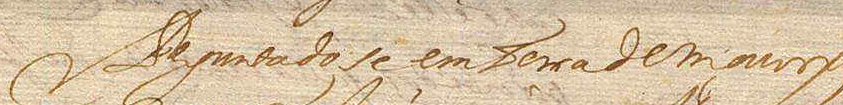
item Peguntado se em Terra de mouros
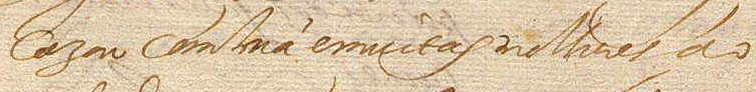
cazou com huā e muitas molheres ao
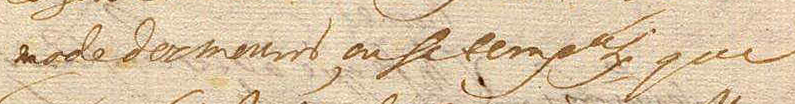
modo doz mouros, ou se tem pa sy que
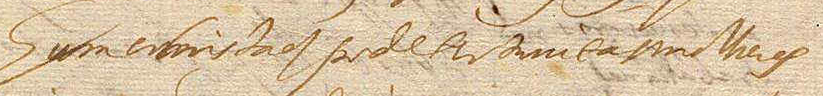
hum christaõ pode ter muitas molheres
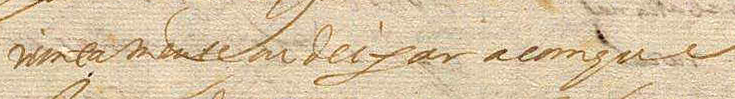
iuntamente ou deixar a com que
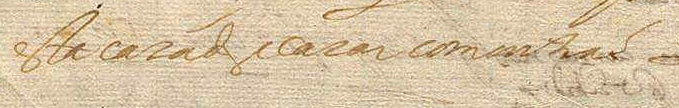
esta cazado e cazar com outra?
